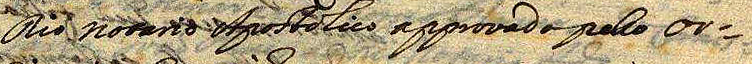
Rio notario Apostolico approvado pello or
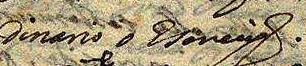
dinario o Escreui.
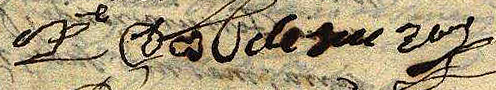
o Pe Dos de souza
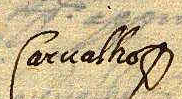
Carualho
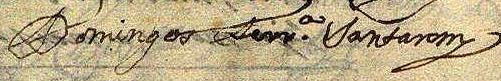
Domingos Ferr.a Santarem
